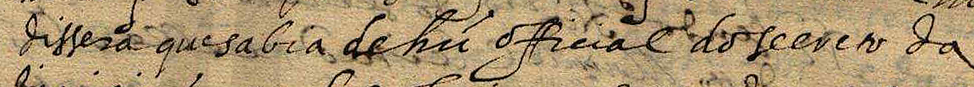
dissera que sabia de hū official do secreto da
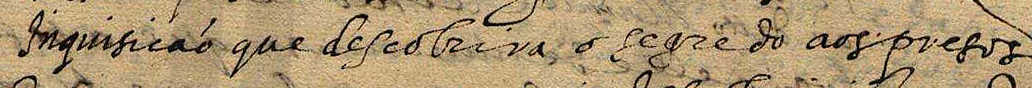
Inquisiçaõ que descobrira o segredo aos presos
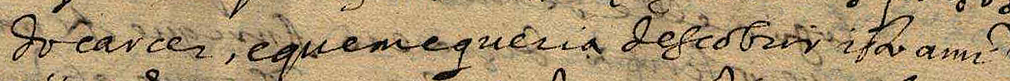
do carcer, e que me queria descobrir isto a mī
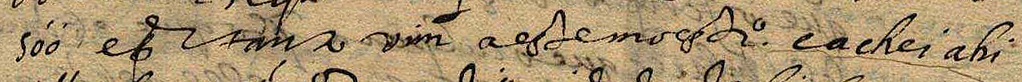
sóo e p̄otanto vim a este moestro. e achei ahi
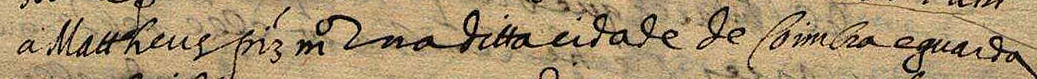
a Mattheus piz̄ mor na ditta cidade de Coimbra e guarda
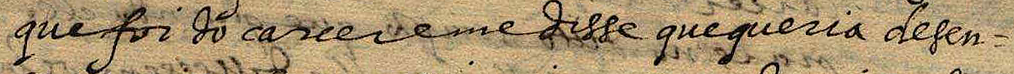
que foi do carcere me disse que queria desen
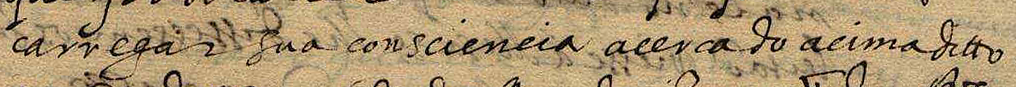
carregar sua consciencia acerca do acima ditto
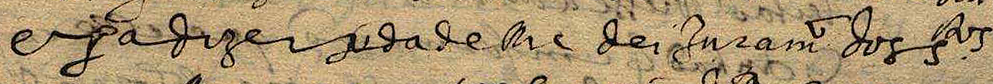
e ꝑa dizer ꝟdade lhe dei Juramto dos s.tos
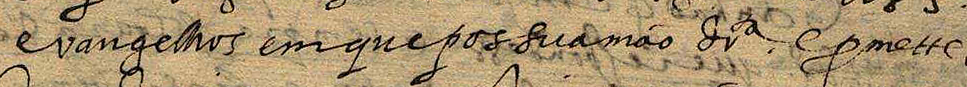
evangelhos em que pos sua maõ drta. e ꝓmetteo
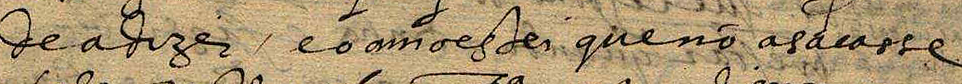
de a dizer / e o amoestei que nō asacasse
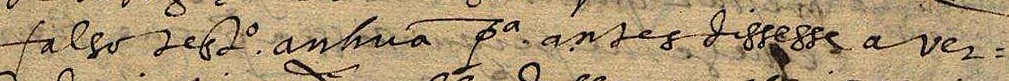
falso testo. a nhuā pa. antes dissesse a ver
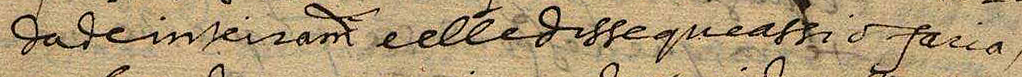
dade inteiramte e elle disse que assi o faria /
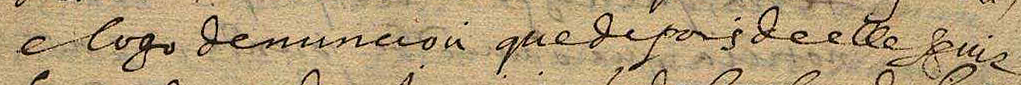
e logo denunciou que depois de elle ꞩuir
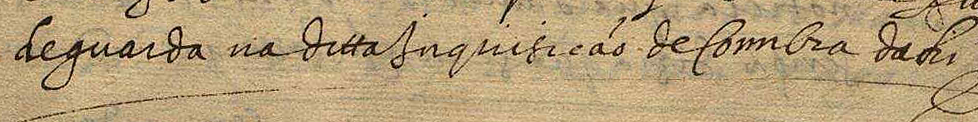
de guarda na ditta Inquisiçaõ de Coimbra dahi
